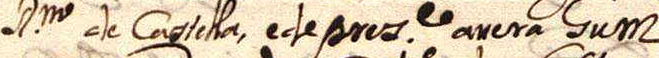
R.no de Castella, e de prez.e auera hum
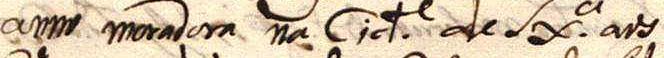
anno moradora na Cid̄.e de Lx.a aos
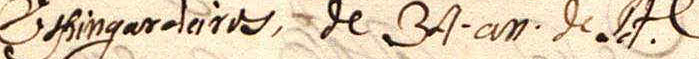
Espingardeiros, de 34. an. de Id̄.e
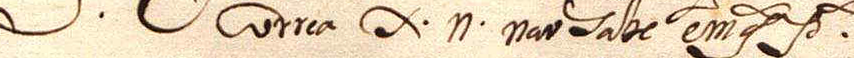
Correa x. n. naõ sabe em qta p.te
